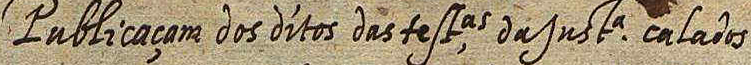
Publicaçam dos ditos das test,as da Justa. calados
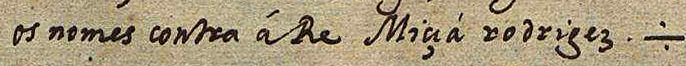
os nomes contra á Re Miçiá rodrigez.
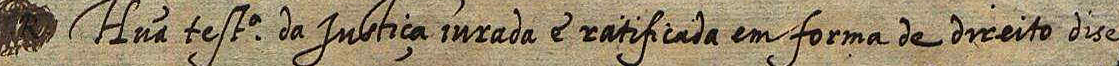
Huā testa. da Justiça iurada e ratificada em forma de direito dise
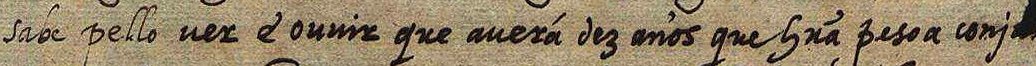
sabe pello uer e ouuir que auerá dez anōs que huā pesoa conj
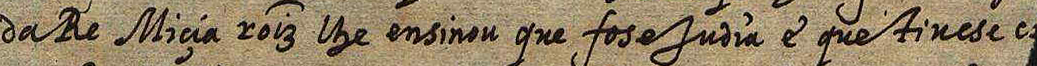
da Re Miçia roīz lhe ensinou que fose Judiā e que tiuese c
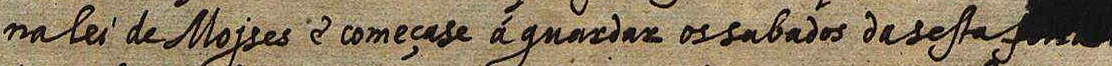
na lei de Mojses e começase á guardar os sabados da sesta f
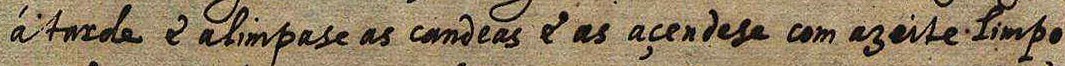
á tarde e alimpase as candeas e as açendese com azeite limpo
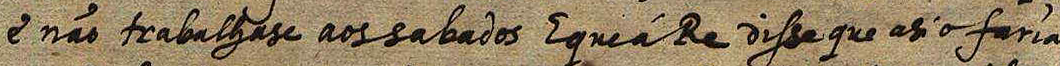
e não trabalhase aos sabados E que á Re disse que asi o faria
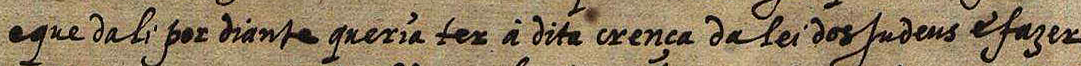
e que dali por diante queria ter a dita crença da lei dos Judeus e fazer
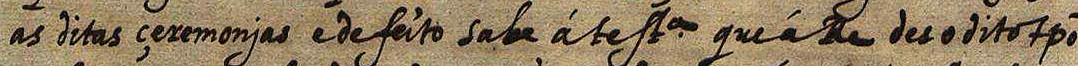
as ditas çeremonjas e defeito sabe á test.a que á Re des o dito tpō
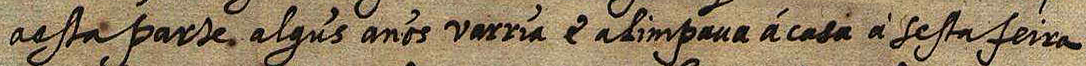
a esta parte algūs anōs varria e alimpaua á casa à sesta feira
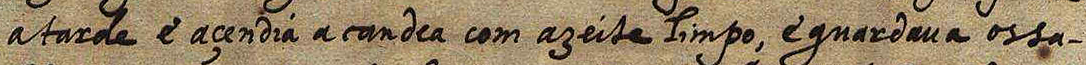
a tarde e açendia a candea com azeite limpo, e guardaua os sa
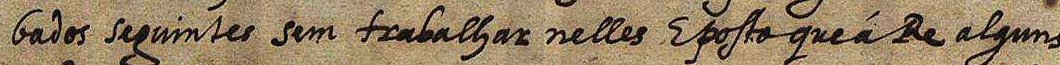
bados seguintes sem trabalhar nelles E posto que á Re alguns
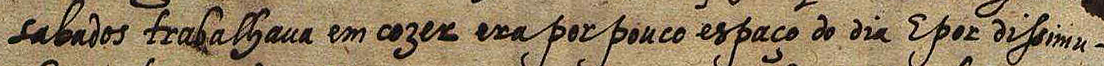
sabados trabalhaua em cozer era por pouco espaço do dia E por dissimu
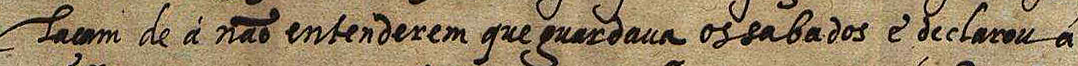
laçam de a não entenderem que guardaua os sabados e declarou á
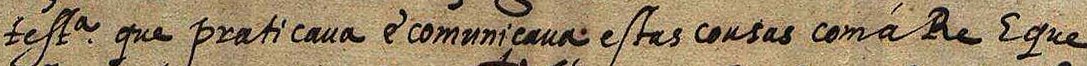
testa. que praticaua e comunicaua estas cousas com a Re E que
